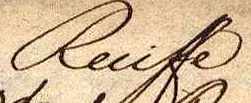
Reciffe
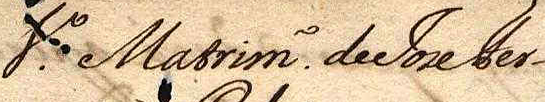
1.o Matrim.o de Ioze Fer
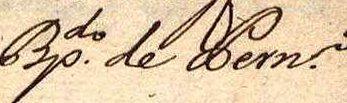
Bp.do de Pern.o
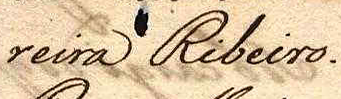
reira Ribeiro.
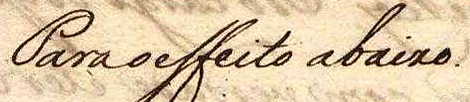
Para o effeito abaixo.
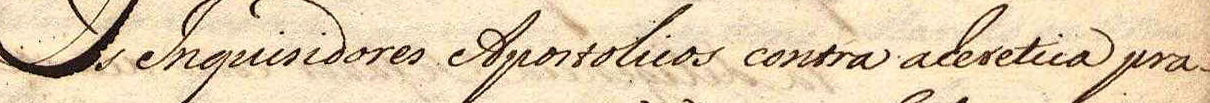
Os Inquisidores Apostolicos contra a heretica pra
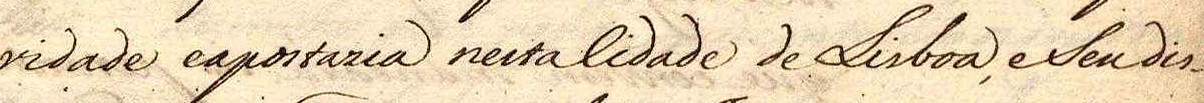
vidade e apostazia nesta Cidade de Lisboa, e Seu dis
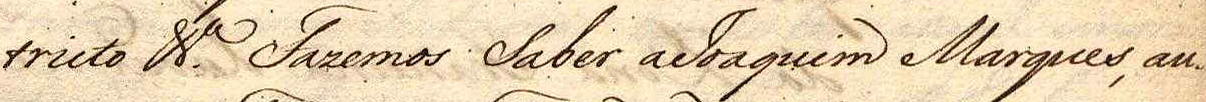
tricto &ra. Fazemos Saber a Ioaquim Marques, au
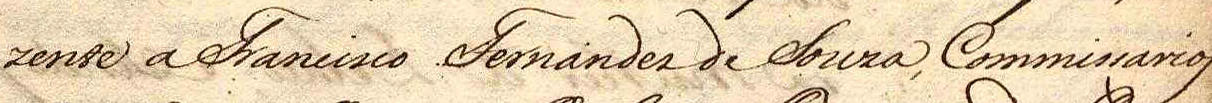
zente a Francisco Fernandes de Souza, Commissarios
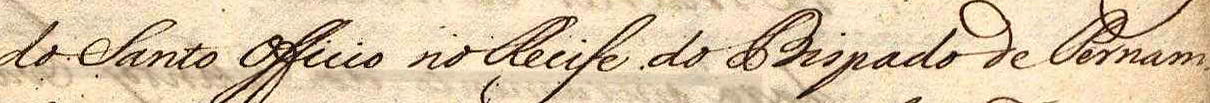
do Santo officio no Recife do Bispado de Pernam
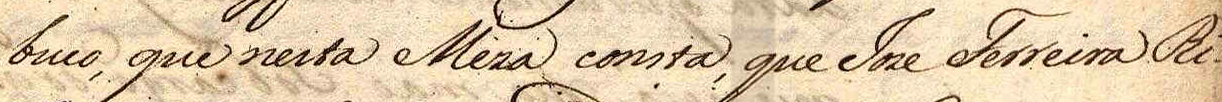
buco, que nesta Meza consta, que Ioze Ferreira Ri
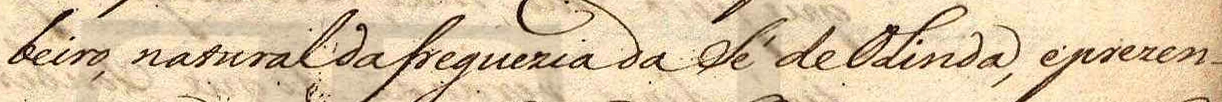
beiro, natural da freguezia da Sé de OLinda, e prezen
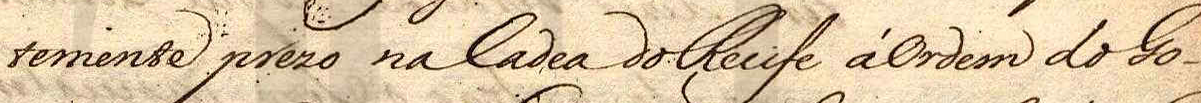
temente prezo na Cadea do Recife á Ordem do Go
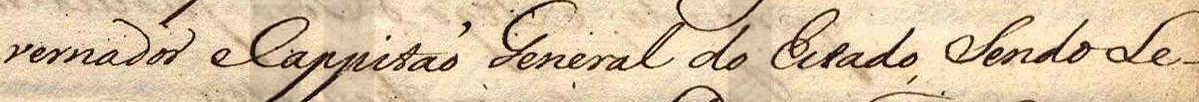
vernador e Cappitaõ General do Estado, Sendo Le
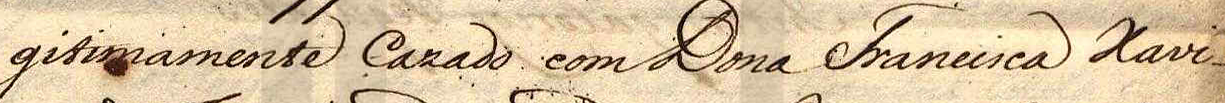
gitimamente Cazado com Dona Francisca Xavi
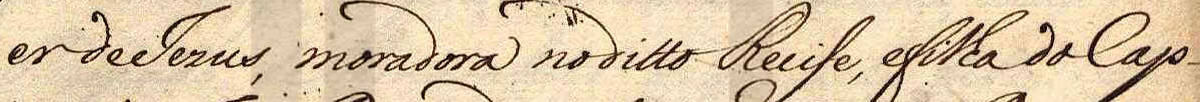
er de Iezus, moradora no ditto Recife, e filha do Cap
